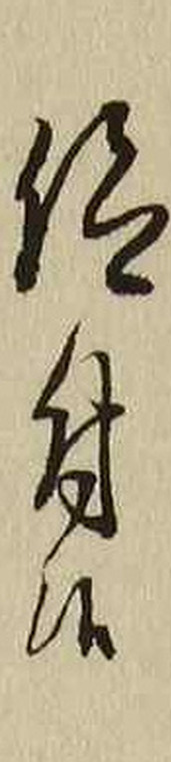仰付候
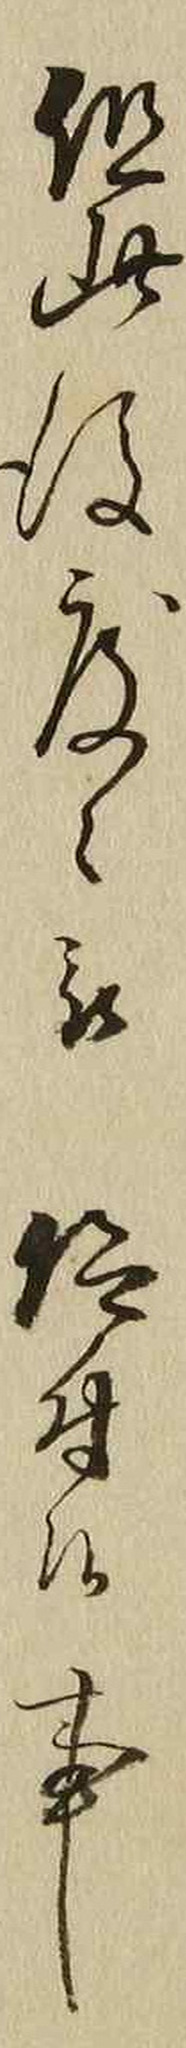但此後度々被仰付候事
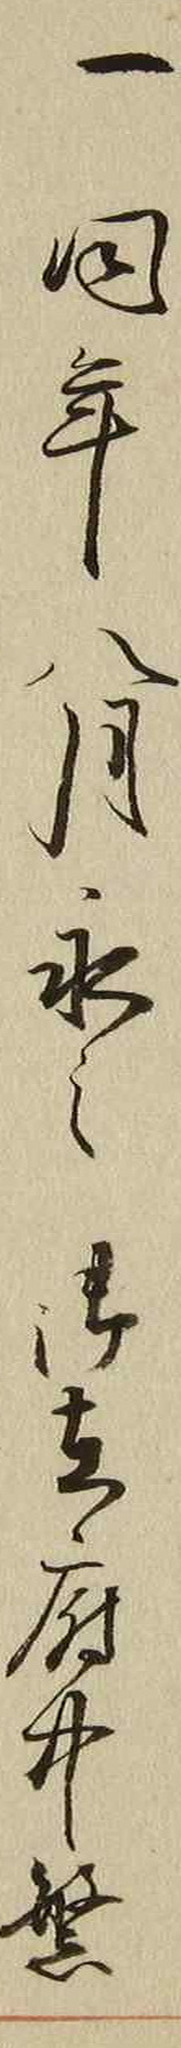一同年八月永の御在府中繁
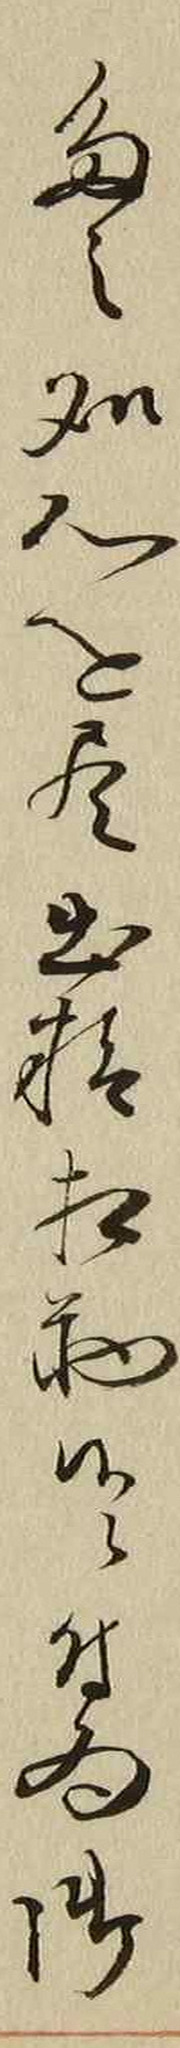多の処心を尽出精相勤候に付為御
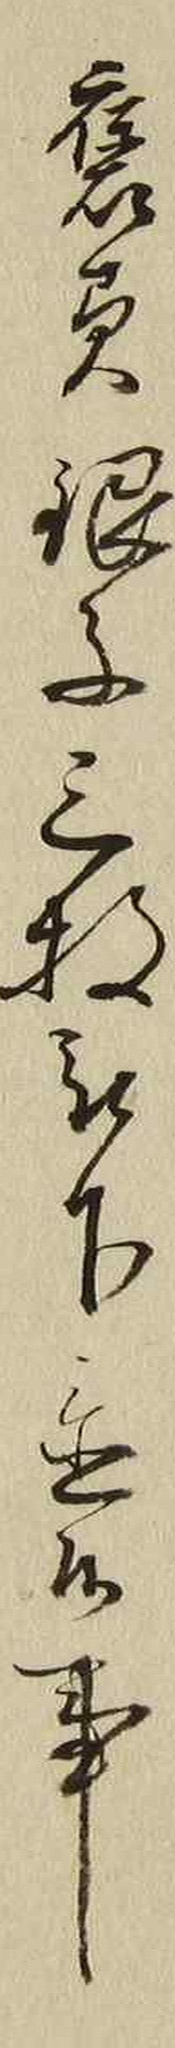褒美銀子三枚被下置候事
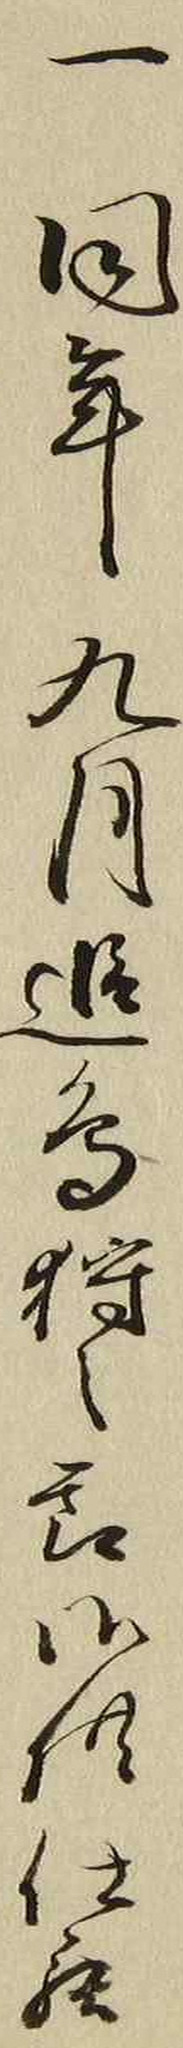一同年九月追鳥狩の節御供仕罷
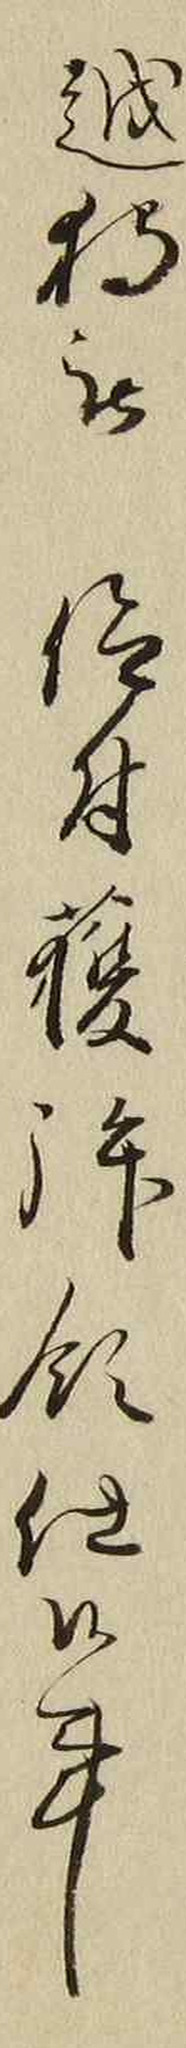越狩被仰付獲拝領仕候事
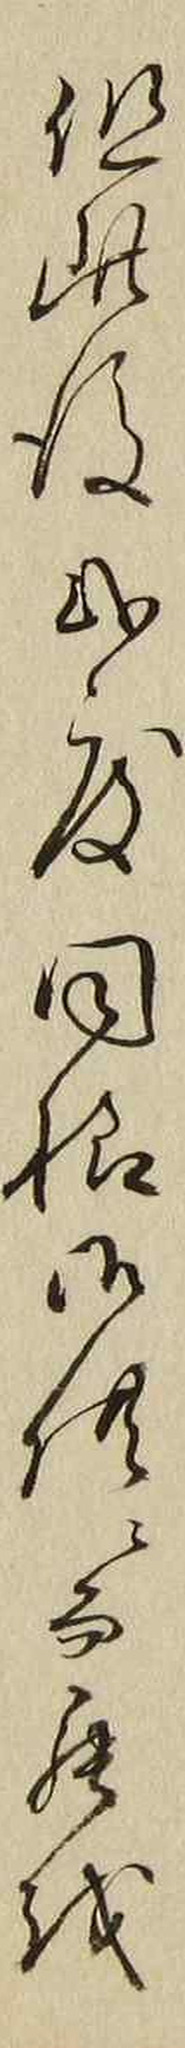但此後弐度同様御供に而罷越
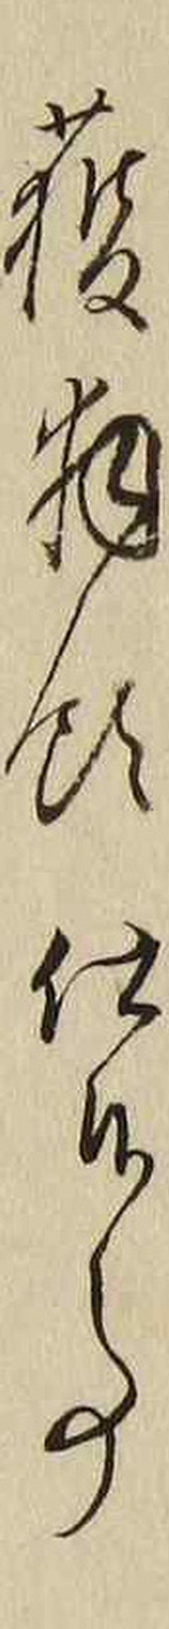獲拝領仕候事
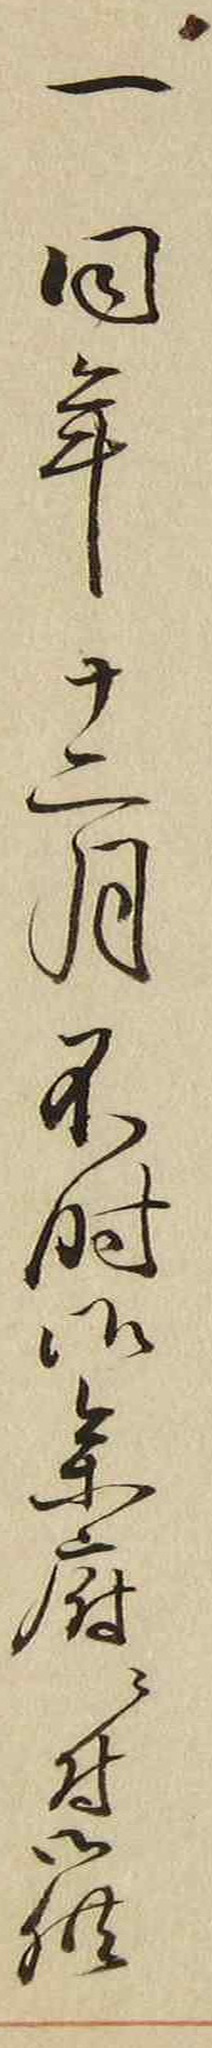一同年十二月不時御参府に付御供

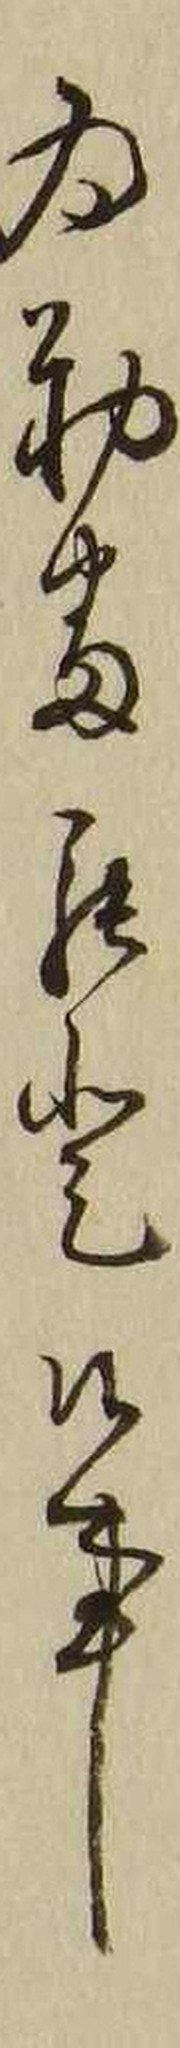為勤番罷登候事
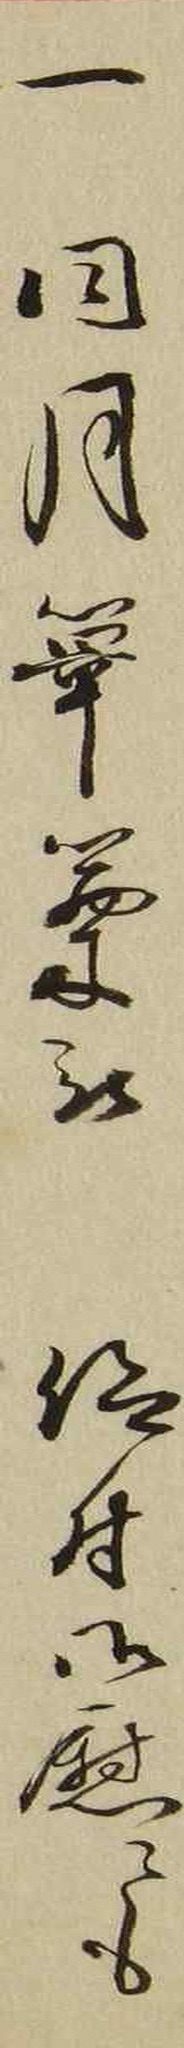一同月篳篥被仰付御慰にも
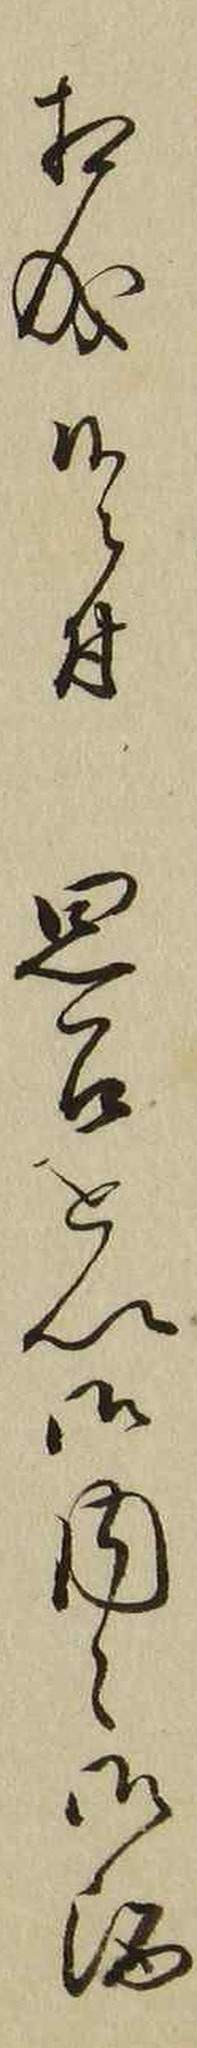相成候に付思召を御内々御酒
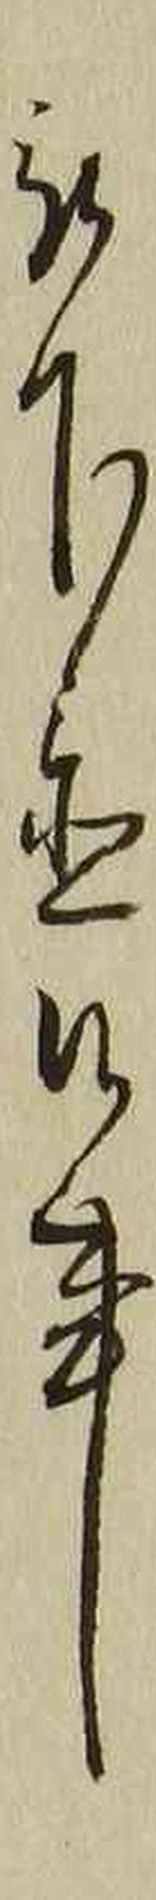被下置候事
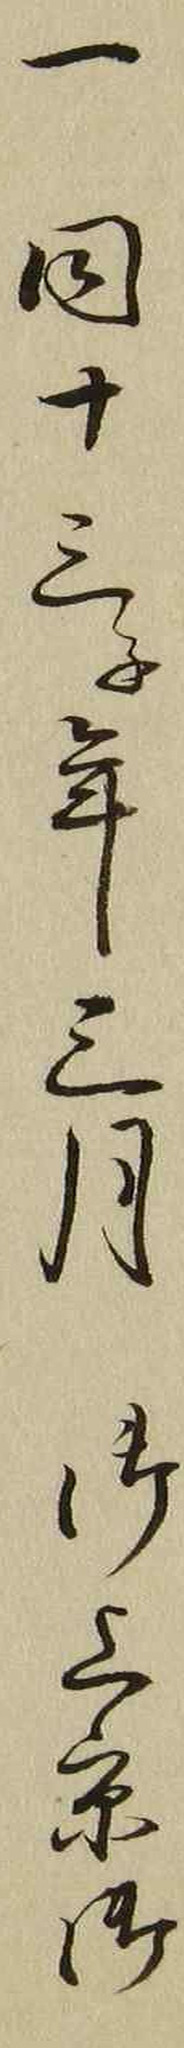一同十三子年三月御上京御
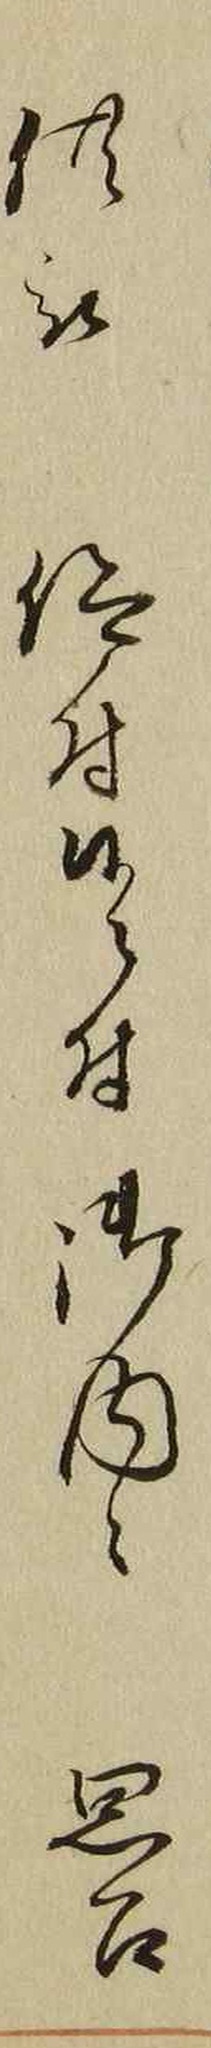供被仰付候に付御内々思召
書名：諸士系譜　巻之1　い之部1
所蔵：会津若松市立会津図書館
